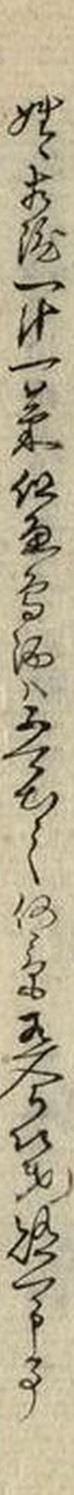姓へ相渡一汁一菜但魚鳥酒ハ不可出之何ニ而も有合次第賄可申事
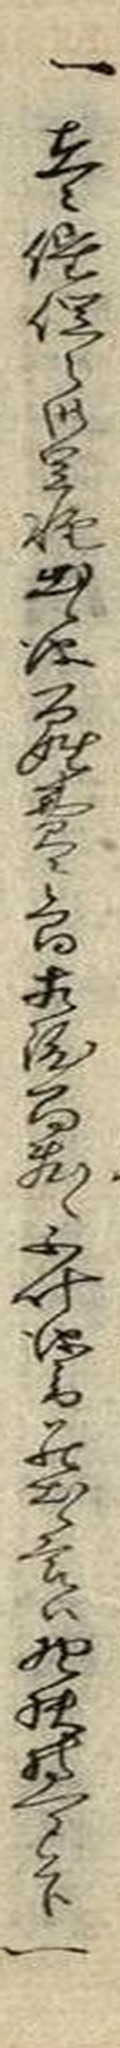一在々催促之御足軽出候儀百姓費ニ候間相渡間敷候不叶儀ニ而罷出候節ハ野扶持可被下一
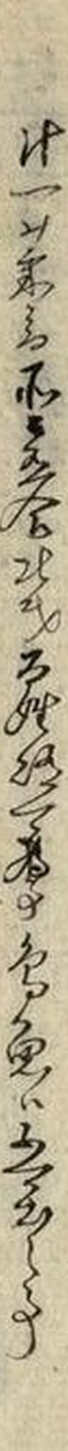汁一菜ニ而所ニ有合次第百姓賄可為事鳥魚ハ不可出之事
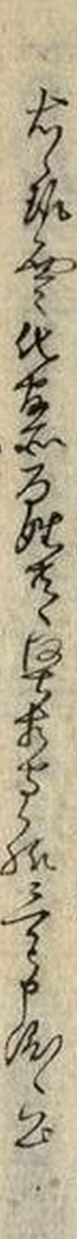右之趣面々代官所百姓共へ堅相守候様ニ可被申渡候以上
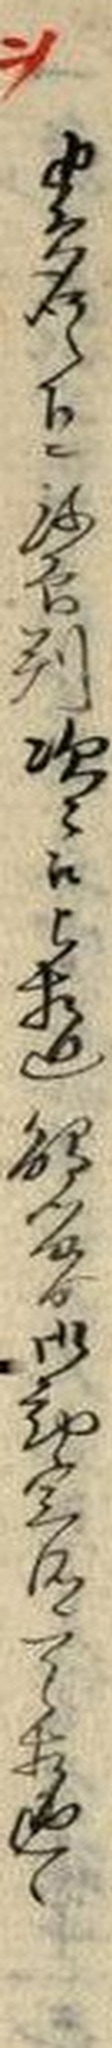追而名之下ニ致印判次々江被相廻触留ゟ御勘定所へ可相返候

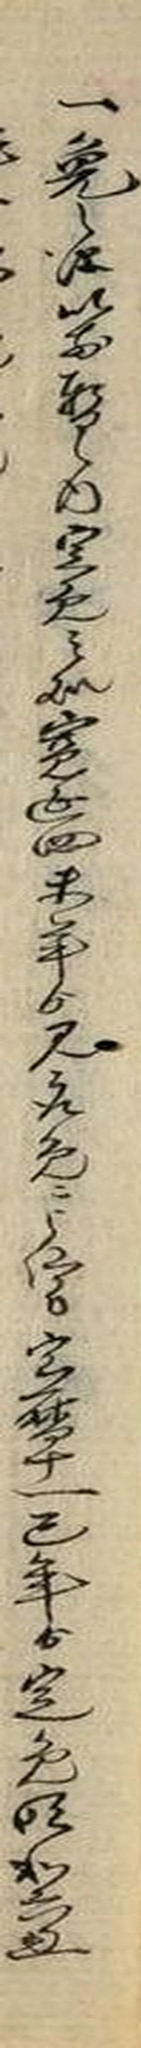一免之儀以前暫之内定免之処寛延四未年ゟ見取免ニ被仰付宝暦十一巳年定免明和六丑
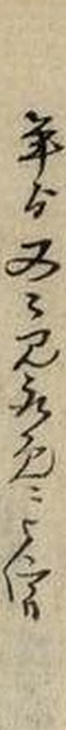年ゟ又々見取免ニ被仰付
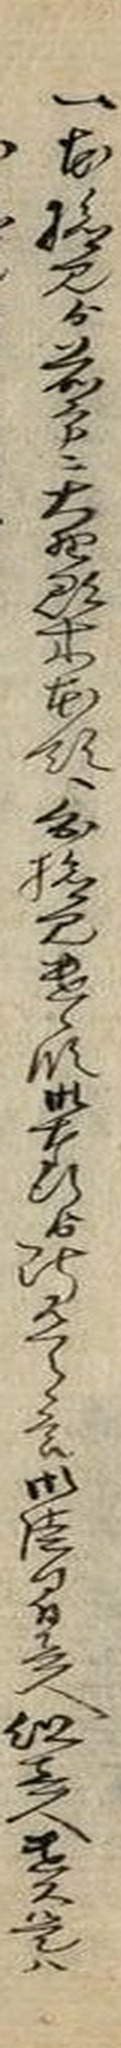一本検見ゟ前方ニ大野郡木本領へ分検見遣候段御奉行ゟ断有之候節御徒目付壱人組壱人遣ス是ハ
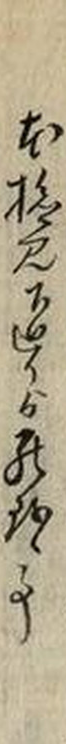本検見下廻りゟ罷越候事
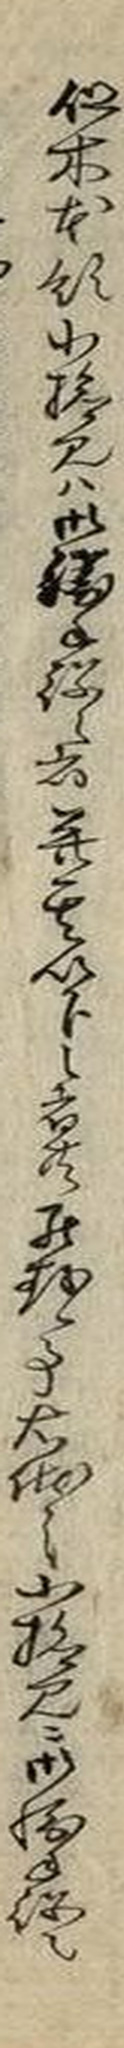但木本領小検見ハ御勝手役之者幷其以下之者共罷越候事右体之小検見ニ御勝手役之
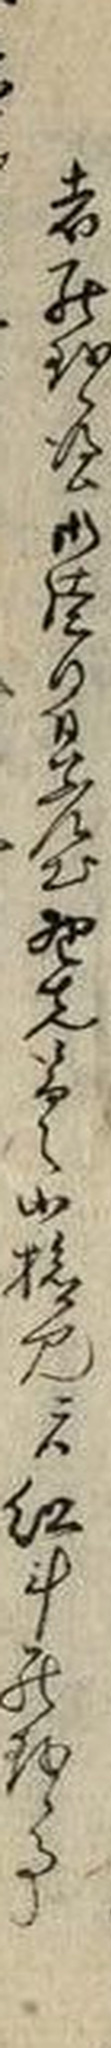者罷越候得ハ御徒目付差出野先ニ而之小検見ニハ組斗罷越候事
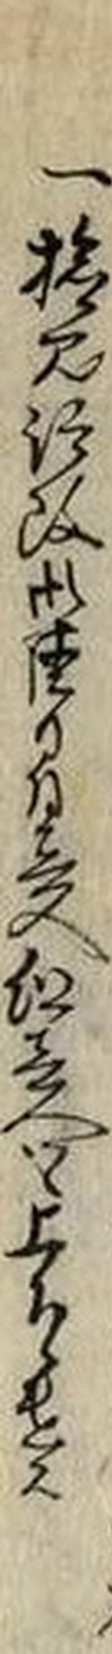一検見跡改御徒目付壱人組壱人ツヽ上下へ遣ス
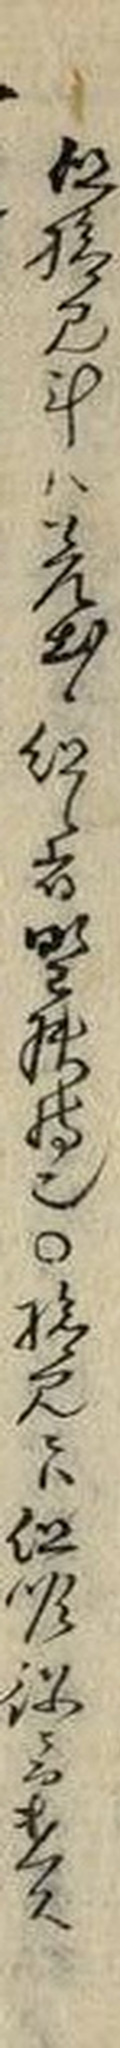但検見斗ハ差出候組之者野扶持也〇検見ニハ組順役ニ而遣ス
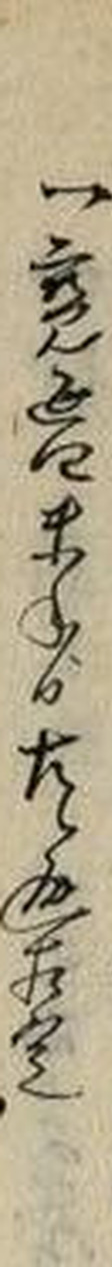一寛延四未年ゟ左之通相定
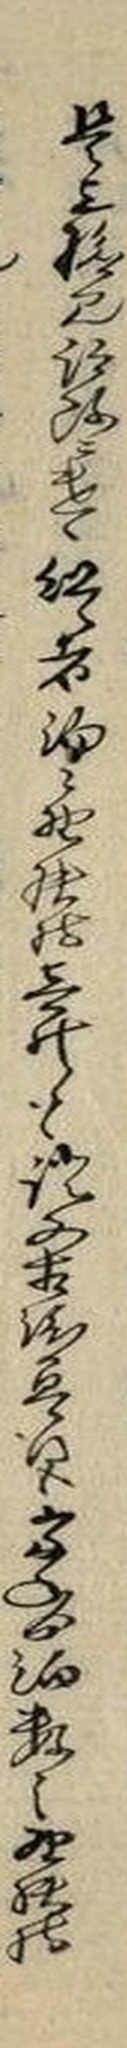是迄検見跡改ニ遣候組之者泊ニ野扶持壱升ツヽ証文相渡置候得共当年ゟ泊数之野扶持
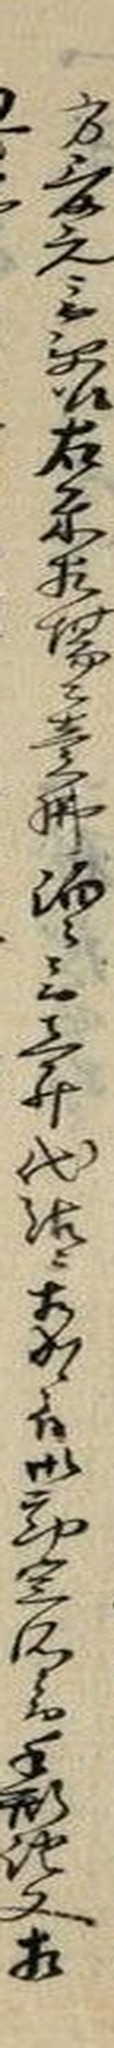方爰元ニ而受取右米相場ニ売払泊々ニ而壱升代銀ニ相成候ニ付御勘定所ニ而手形証文相
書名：御国他国諸事之部
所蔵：福井県文書館 Fukui Prefectural Archives
